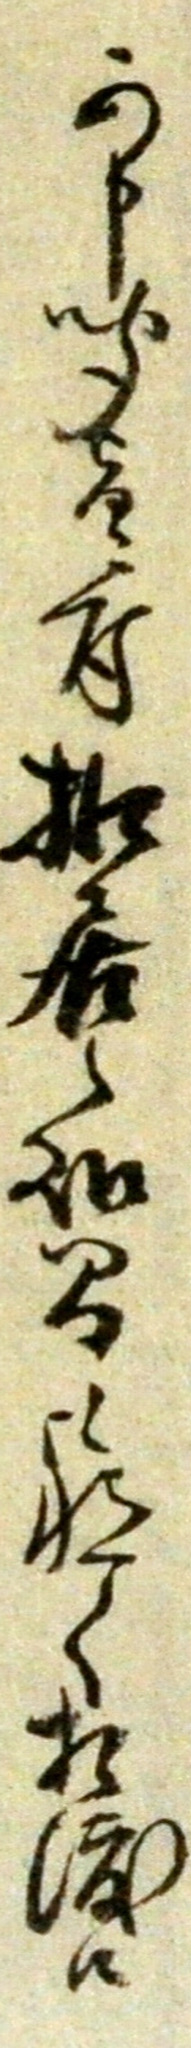可申聞旨ニ付扣居候処間もなく相渡候
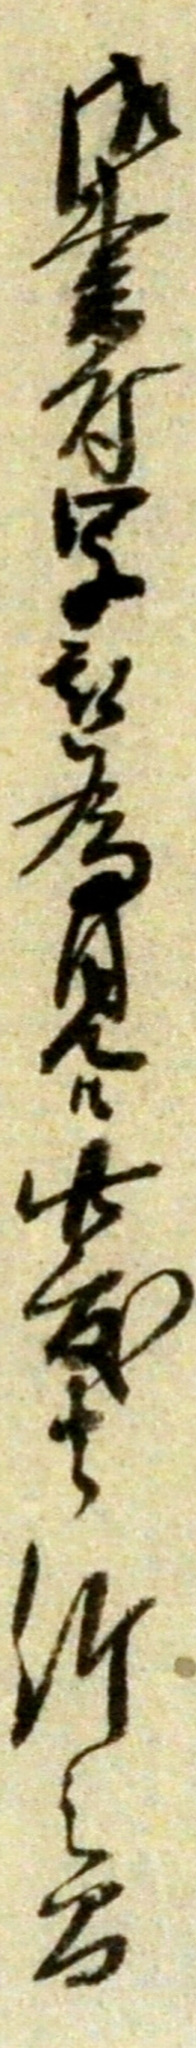御書付写被為見候此度は竹之間
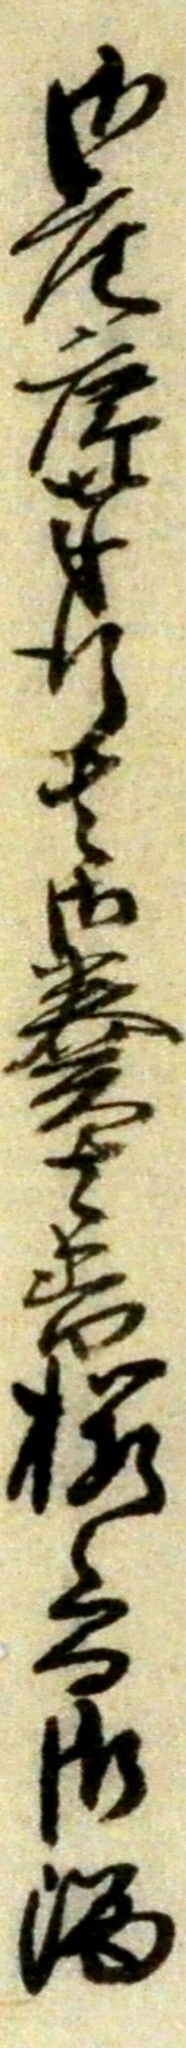御座席奉行は御奏者番桜之間御溜
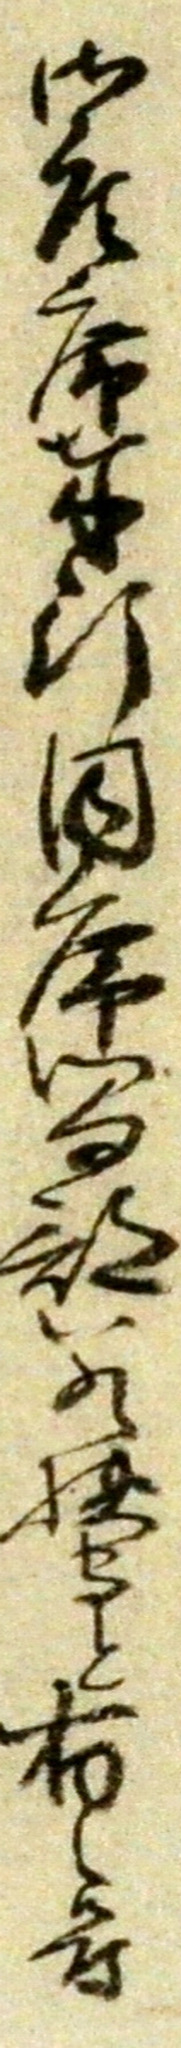御座席奉行同席間部若狭守と有之候付
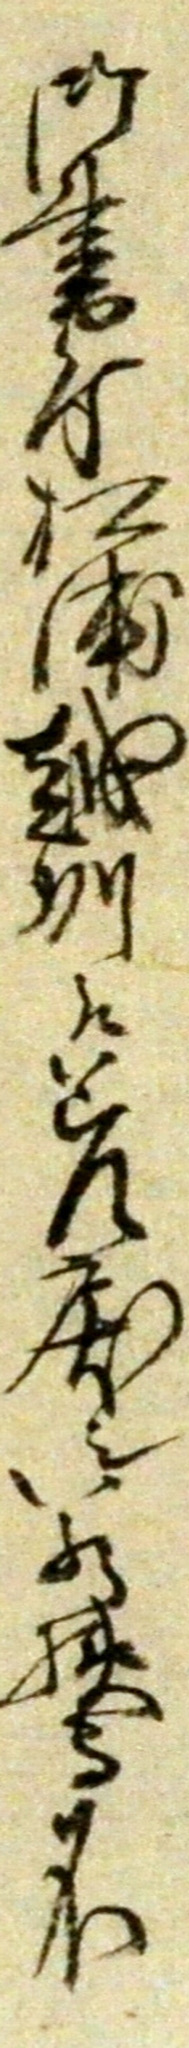御書付松浦越州え差戻シ若狭守被不
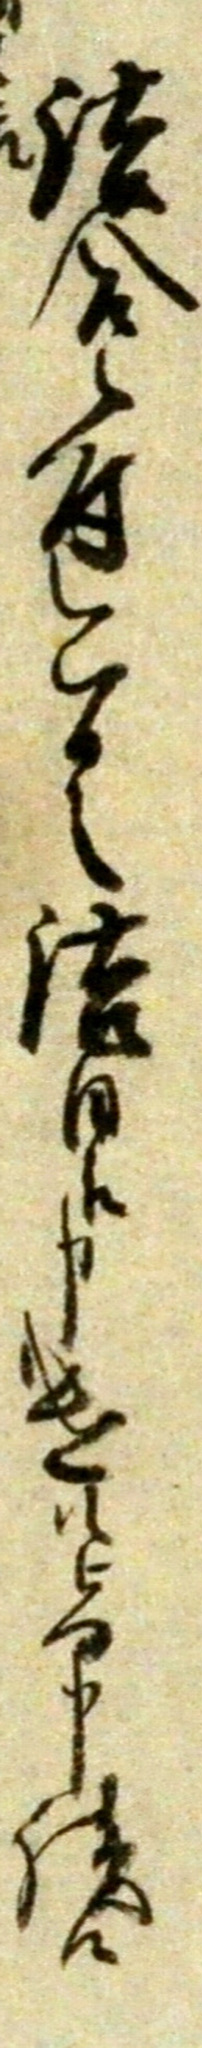詰合候付今日之詰日え申遣候旨申談
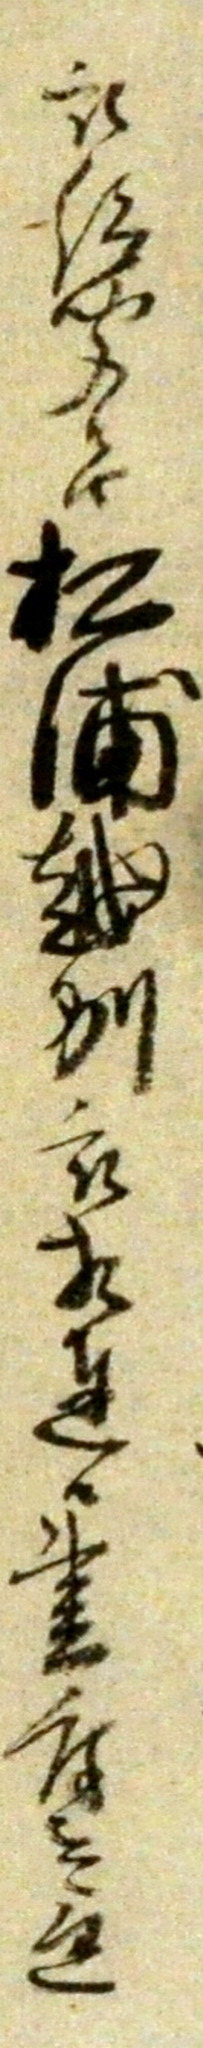被仰聞候由松浦越州被相達候書付壱通
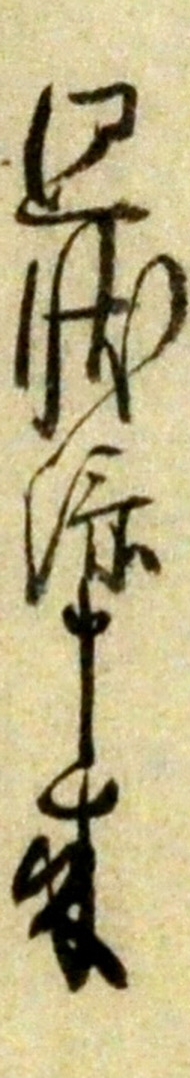廻状添申来
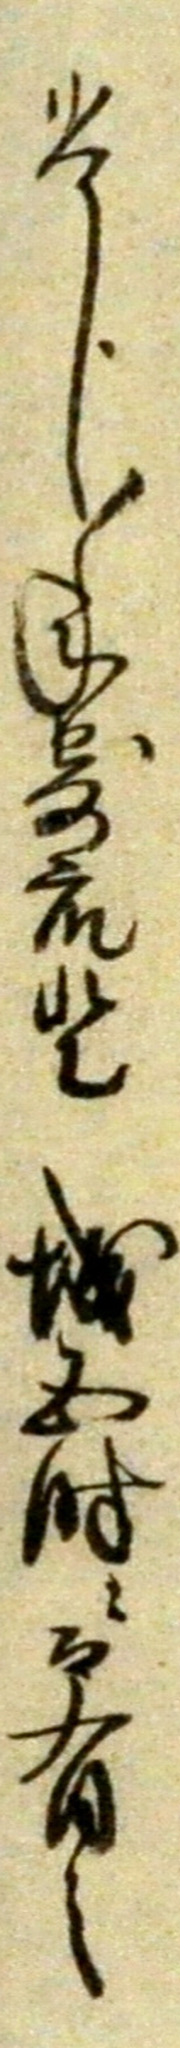尚々年寄衆登城五時ニ而有之
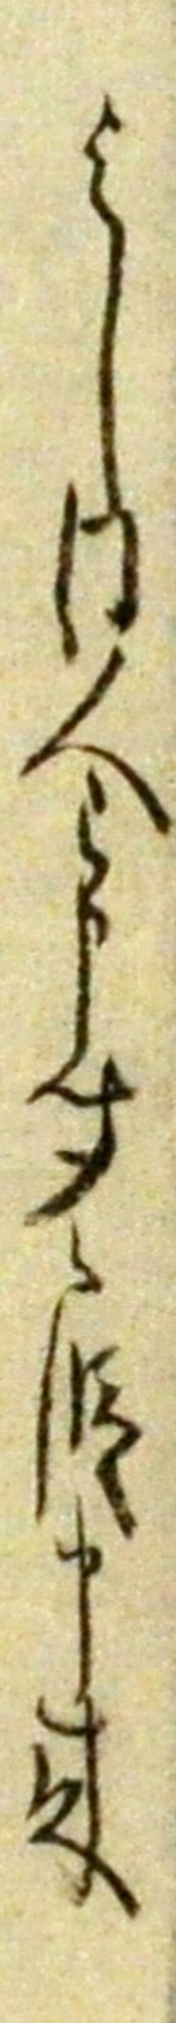よし同人被申聞候段申来
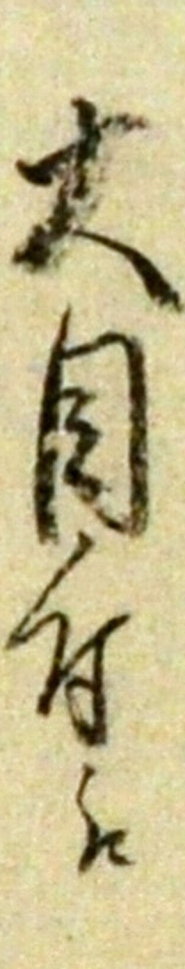大目付え
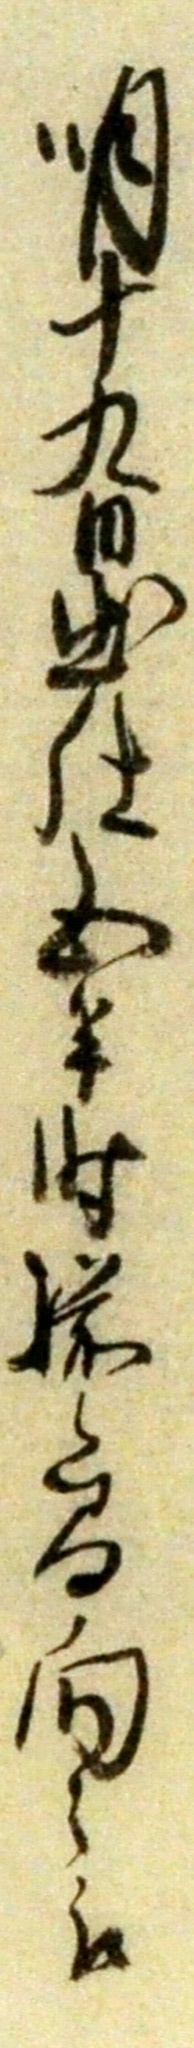明十九日出仕五半時揃候旨向々え
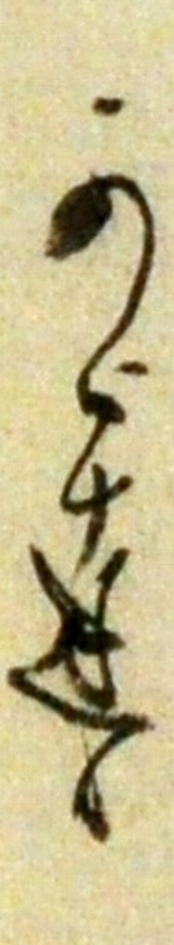可被達候
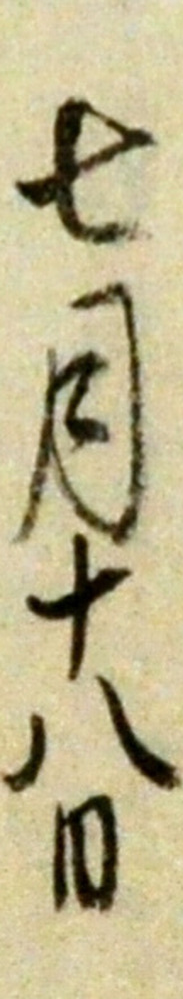七月十八日

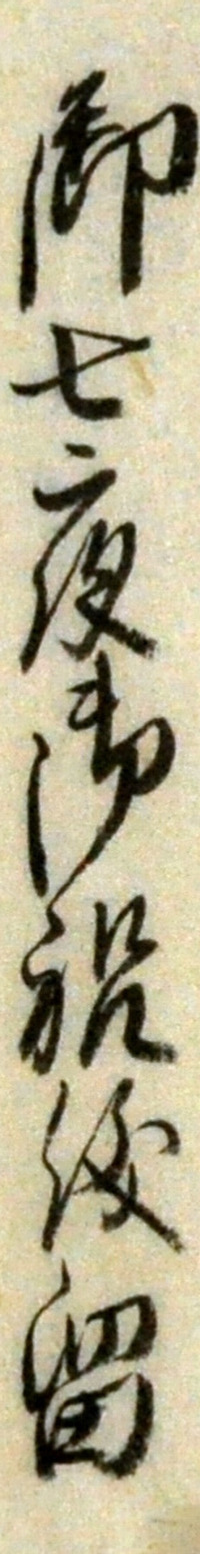御七夜御祝儀留
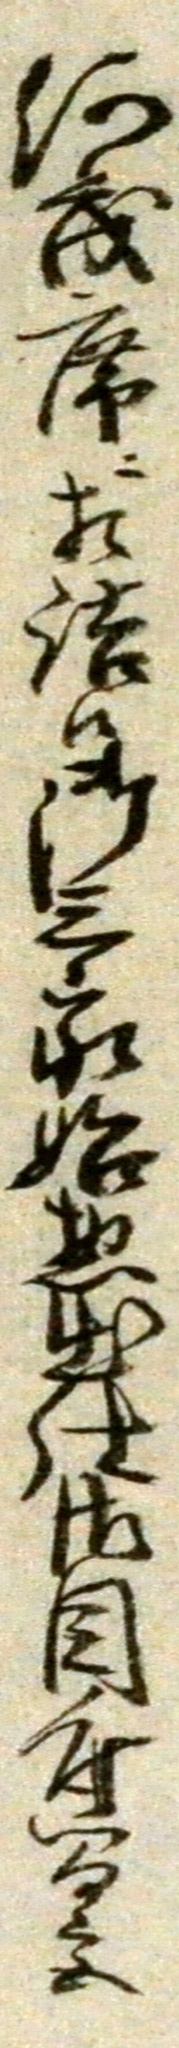何も席ニ相詰候御三家始惣出仕御目付間宮
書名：若君様（家斉嫡男）誕生諸祝儀ノ節ノ留書外
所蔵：伊那市立高遠町図書館・合同会社AMANE
